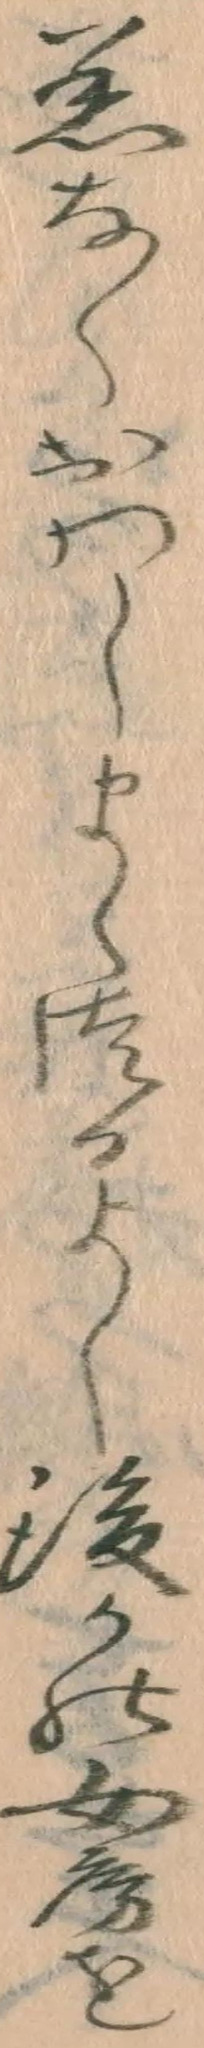恙なくおわしましつるよし後かの女房を
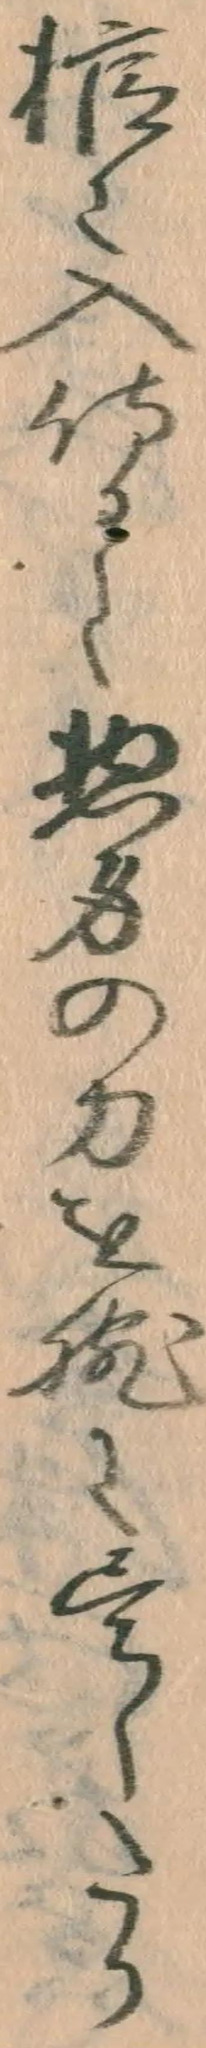棺に入侍るに惣身の力を腕に盡したり
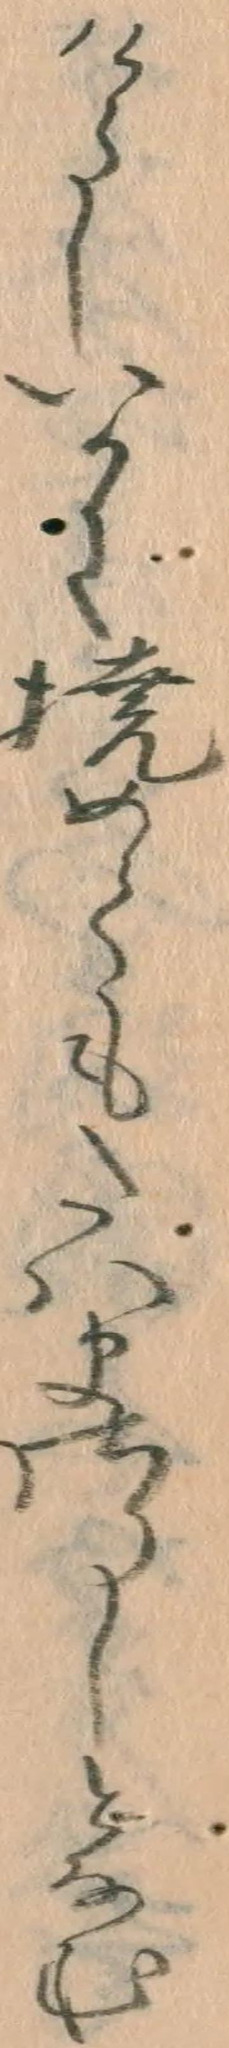けらしいかに撓めてもたハまさりしとなむ
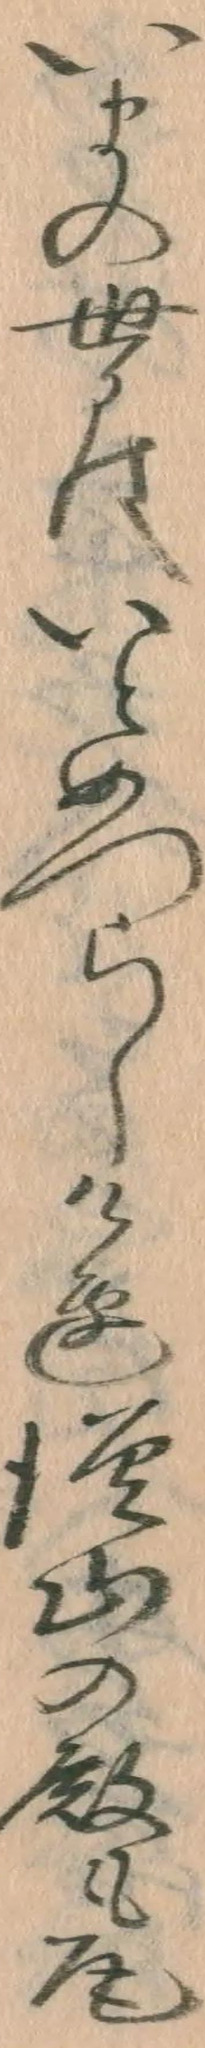いまの世にはいとめつらしけれ増山の殿も瓦
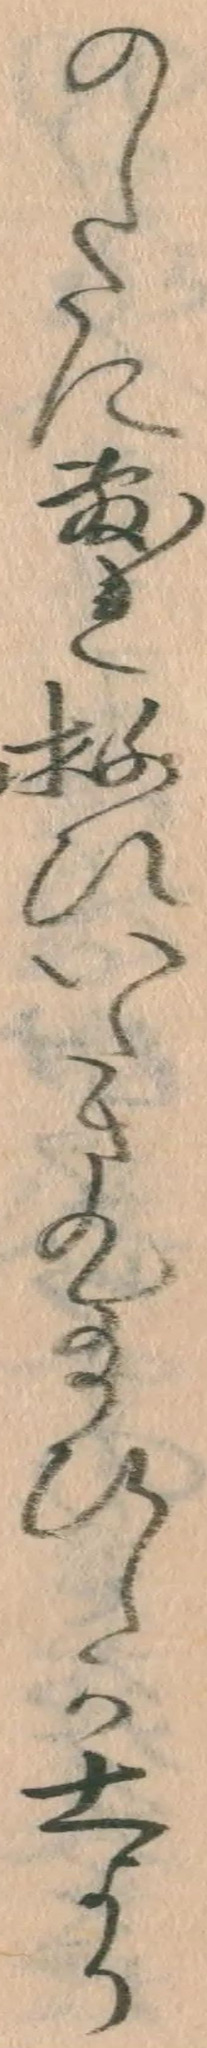のしたに敷れ救ひいたされ玉ひしか士より
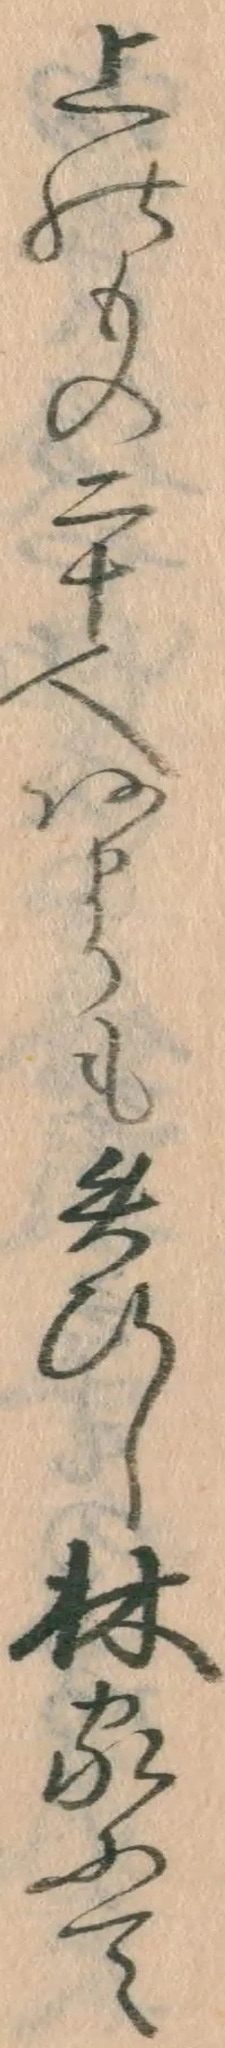上のもの二十人あまりも失ひし林家にて
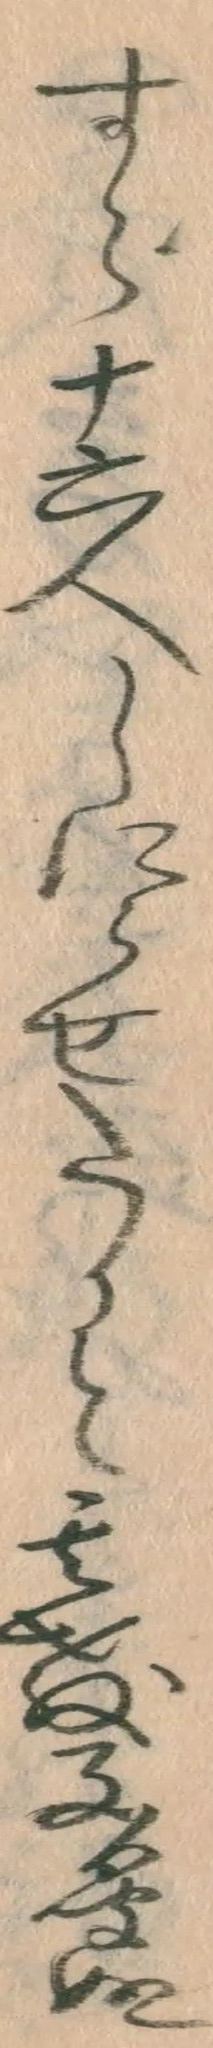すら十六人しにらせたりと其教子ゟ聞ぬ
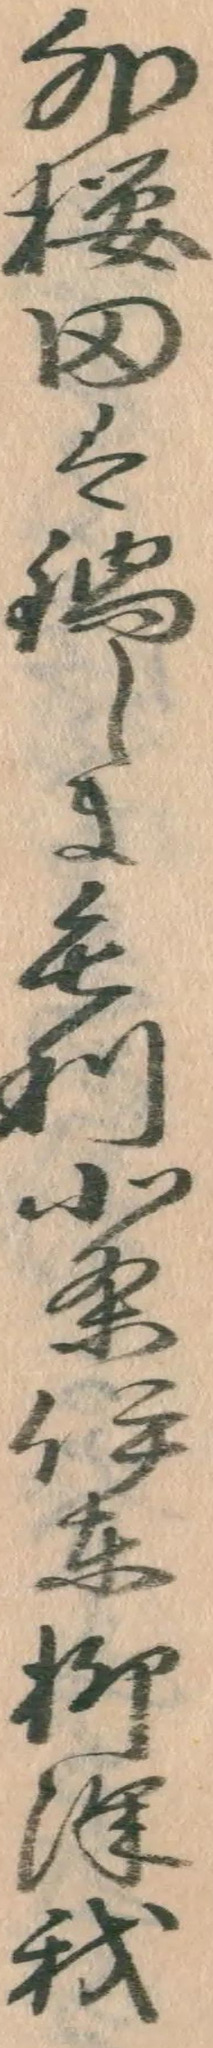外桜田は鍋しま毛利北条伊東柳澤我
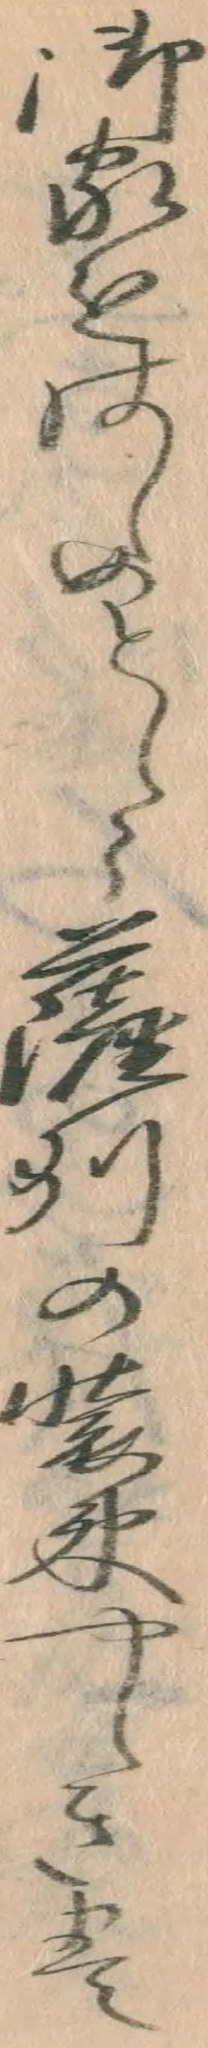御家をはしめとして薩州の装束やしきは
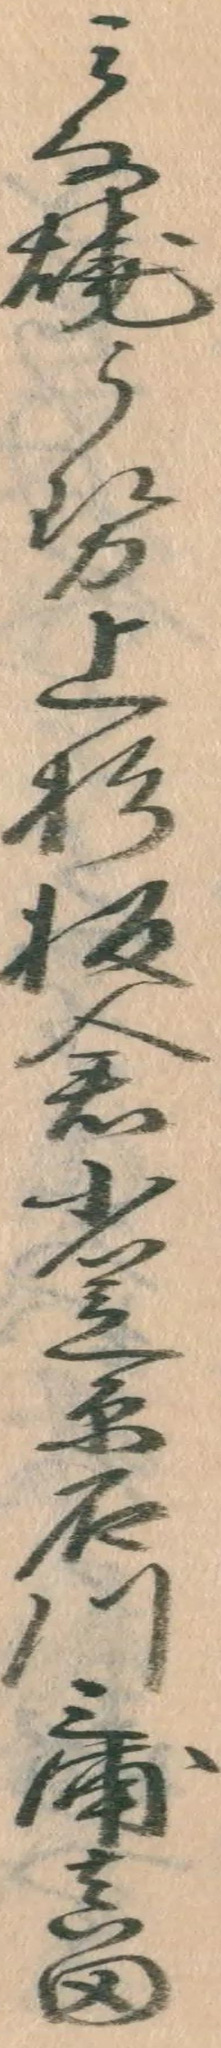ミな燒うせ上杉板倉小笠原石川三浦真田
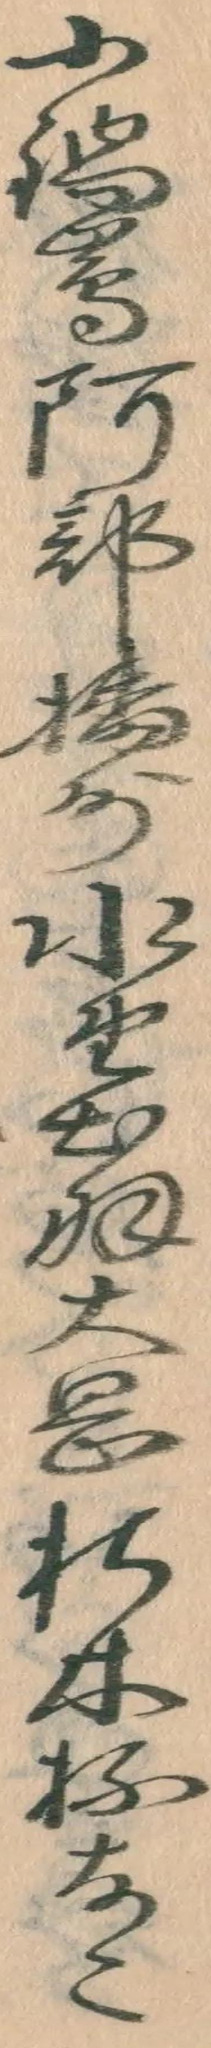小鍋嶋阿部播州水野出羽大岡朽木抔なこ
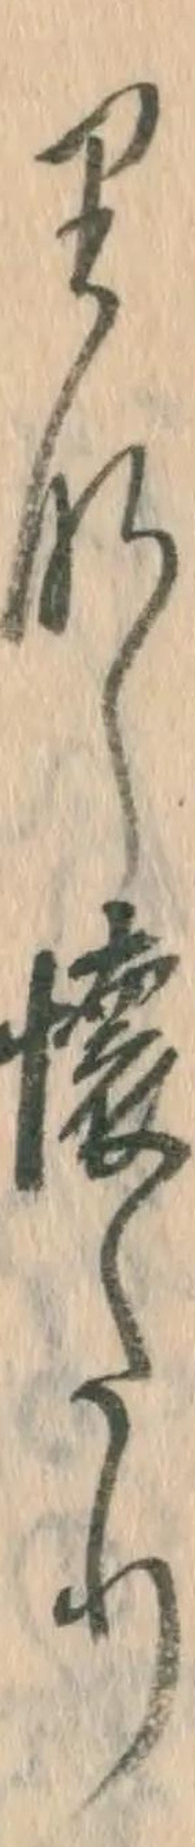りなく壊たり
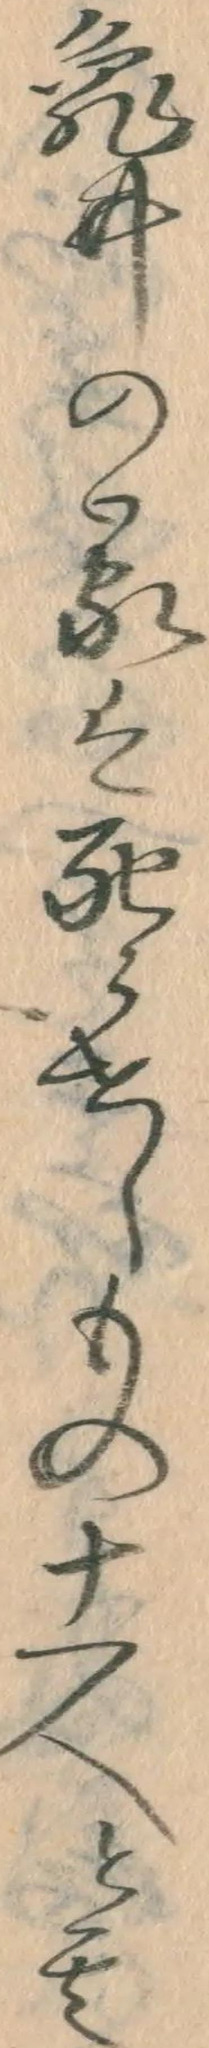亀井の御家は死うせしもの十一人と其
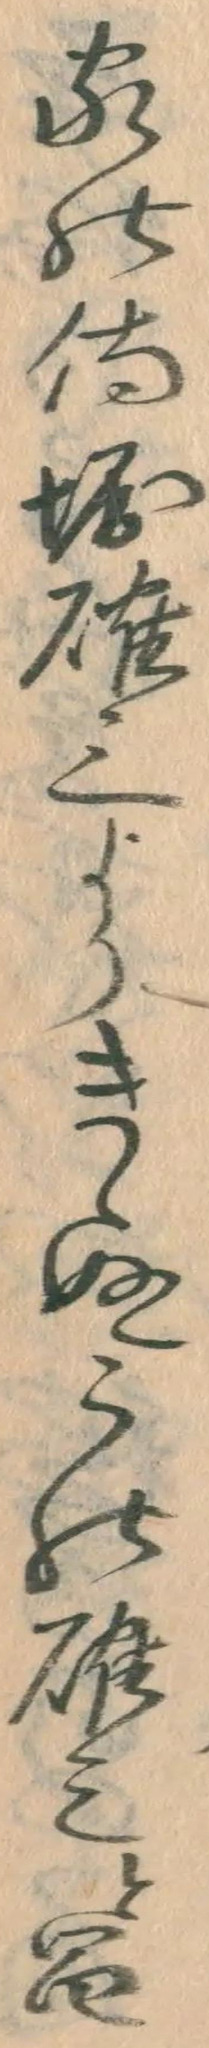家の侍堀確三よりきヽぬこの確三と昌

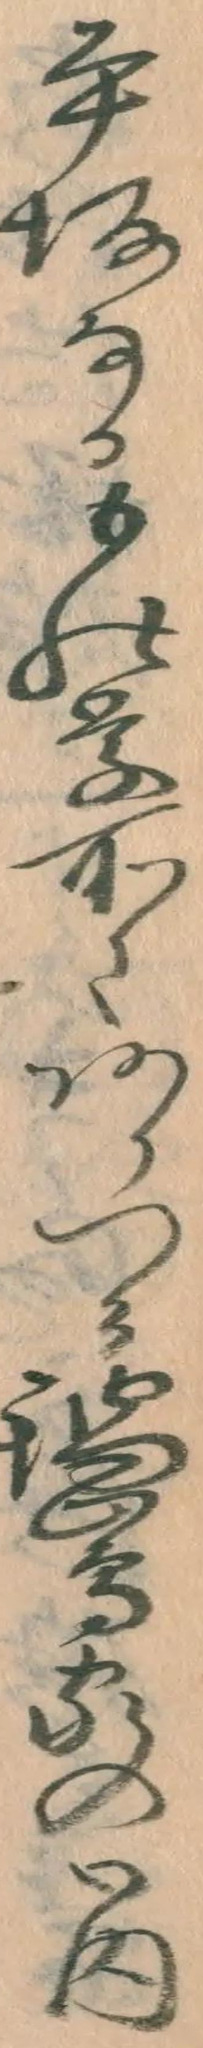平坂なるもの学所にありつる鍋嶋家の御内
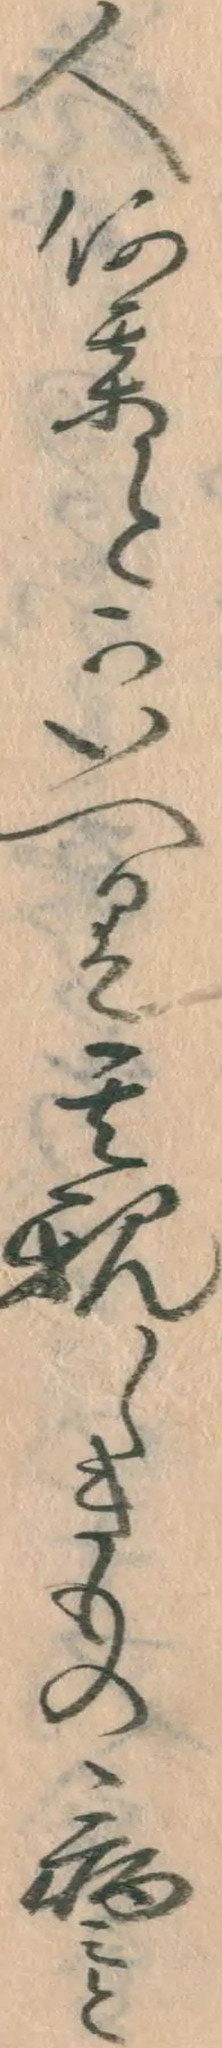人何某とかいへるは其親しきものヽ病ミと
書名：麗斎叢書. 20
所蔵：国立国会図書館 National Diet Library, JAPAN
